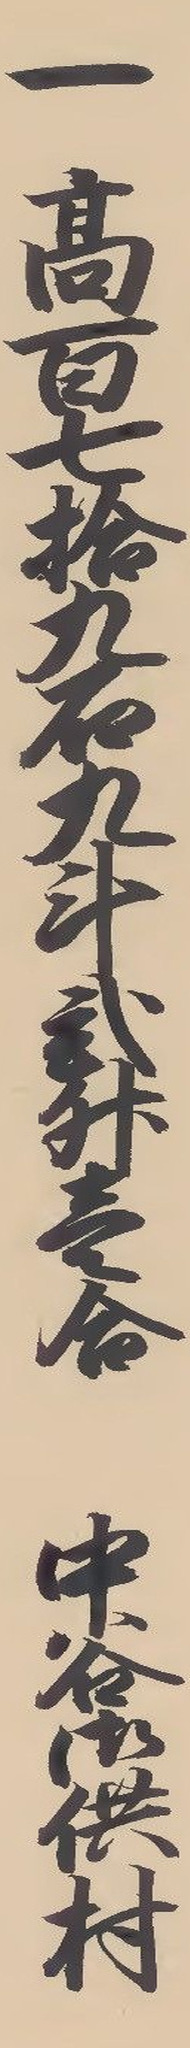一高百七拾九石九斗弐升壱合中谷御供村
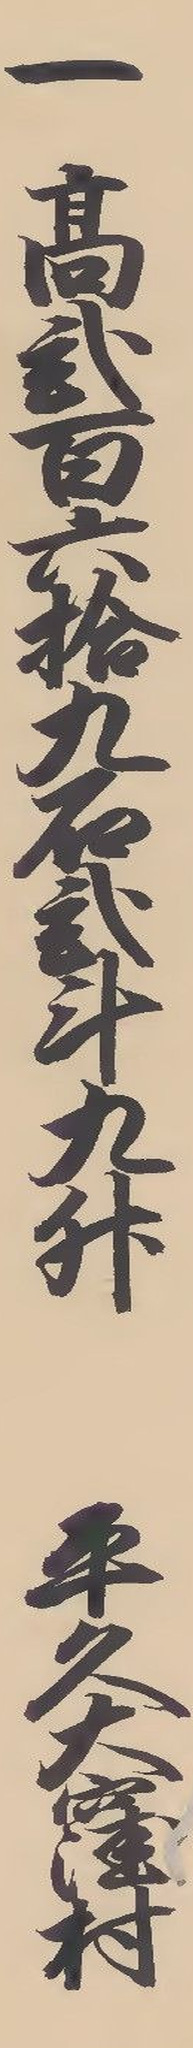一高弐百六拾九石弐斗九升平久大窪村

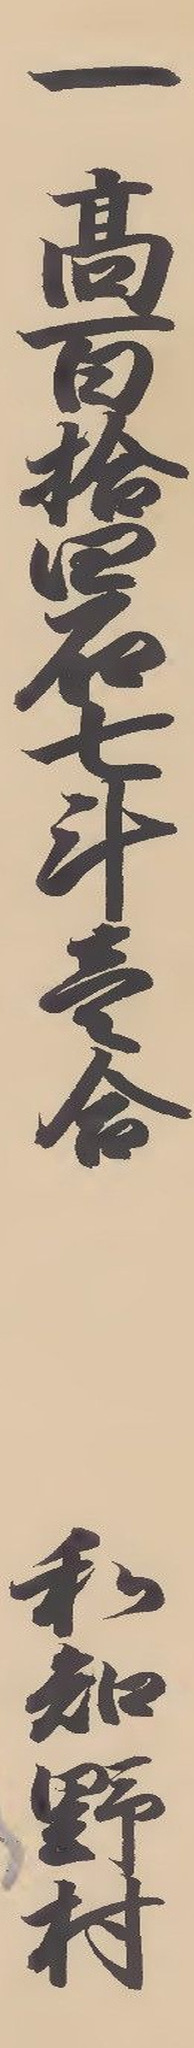一高百拾四石七斗壱合和知野村
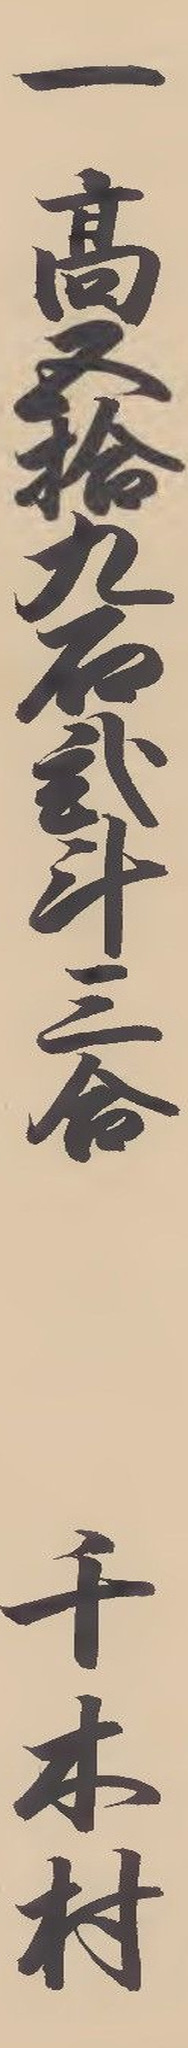一高五拾九石弐斗三合千木村
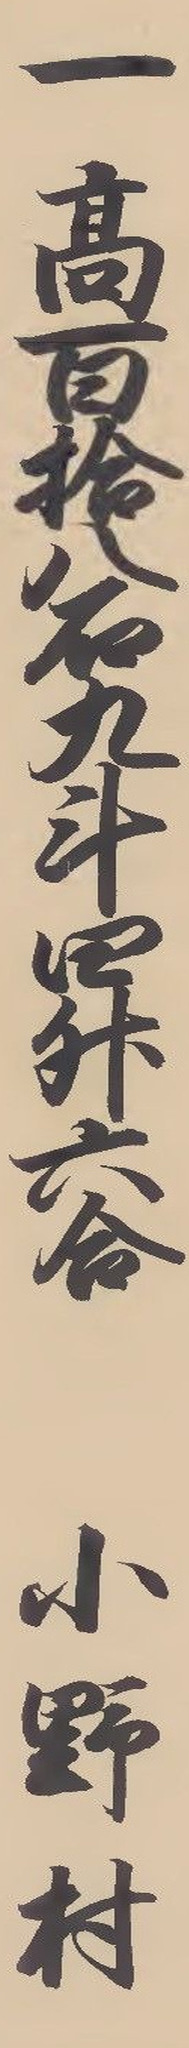一高百拾八石九斗四升六合小野村
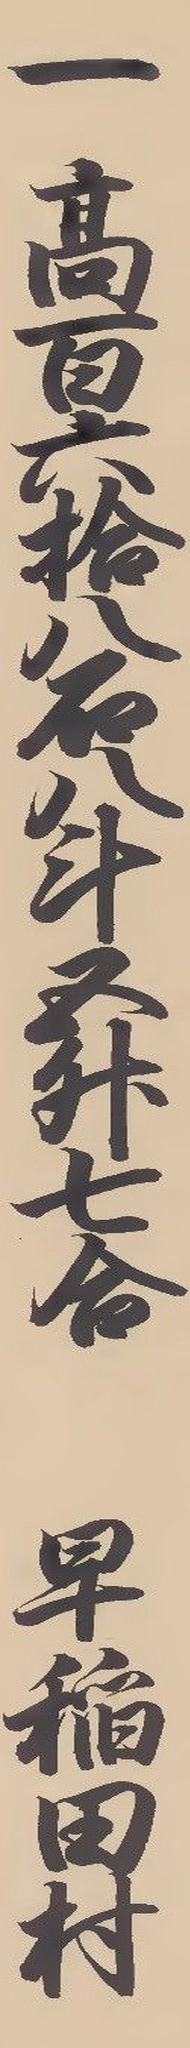一高百六拾八石八斗五升七合早稲田村
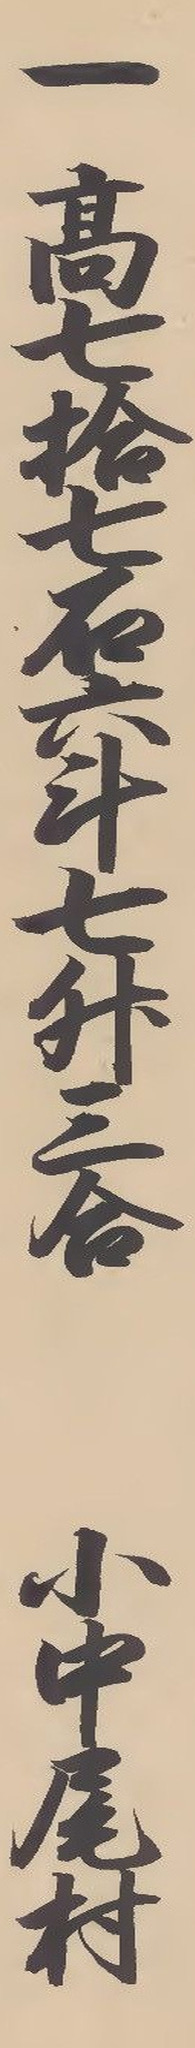一高七拾七石六斗七升三合小中尾村
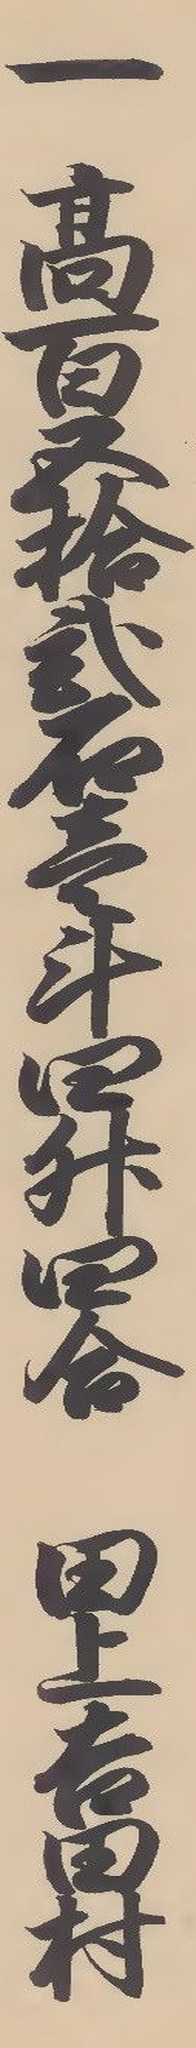一高百五拾弐石壱斗四升四合田上吉田村
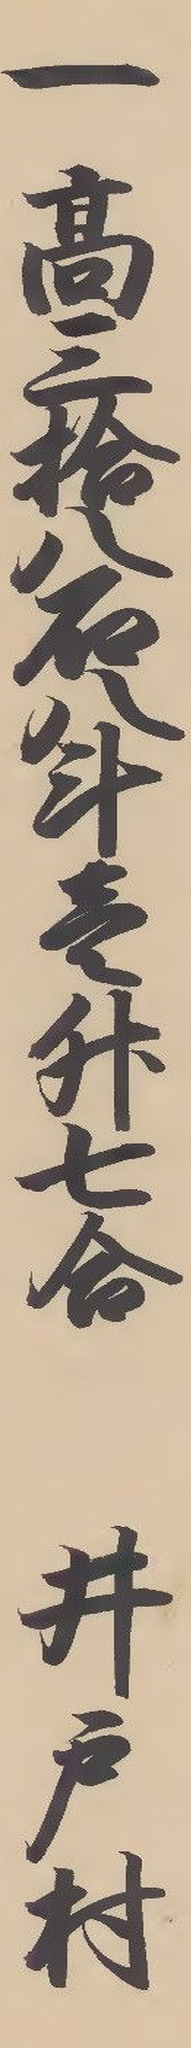一高三拾八石八斗壱升七合井戸村

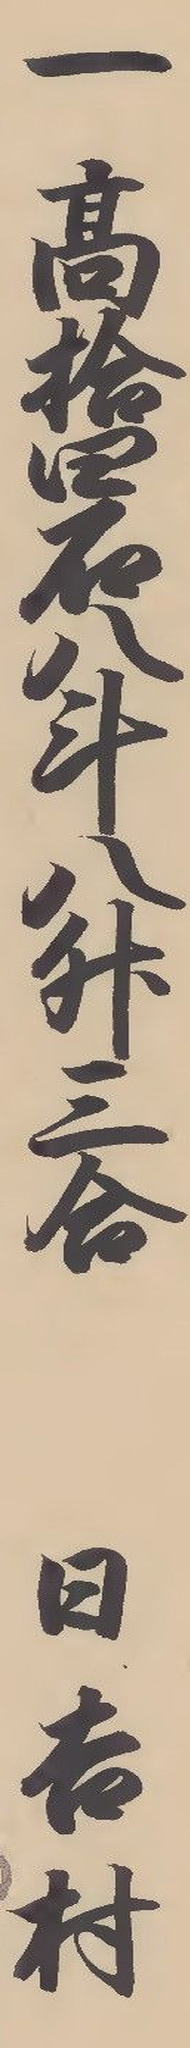一高拾四石八斗八升三合日吉村
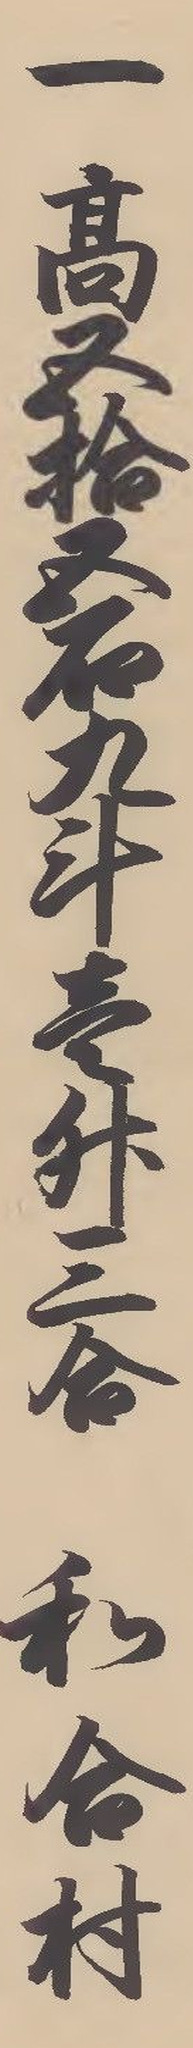一高五拾五石九斗壱升三合和合村
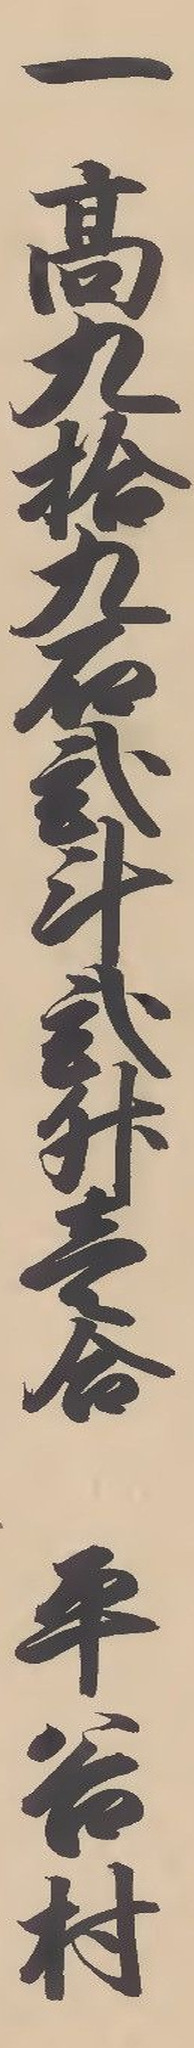一高九拾九石弐斗弐升壱合平谷村
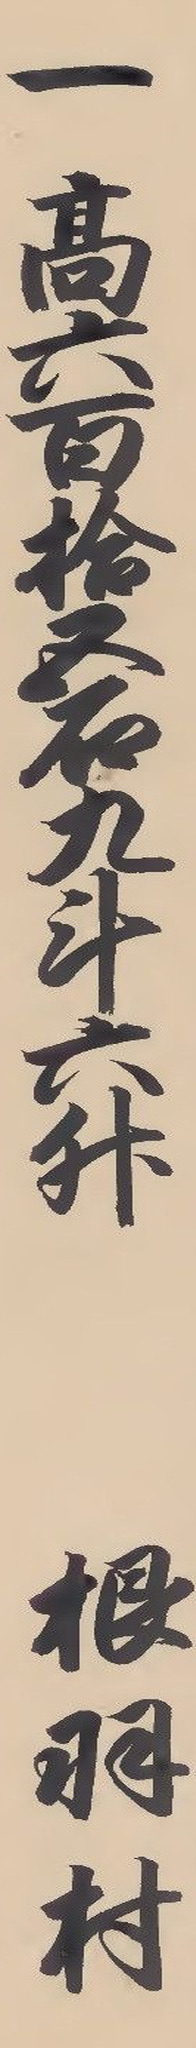一高六百拾五石九斗六升根羽村
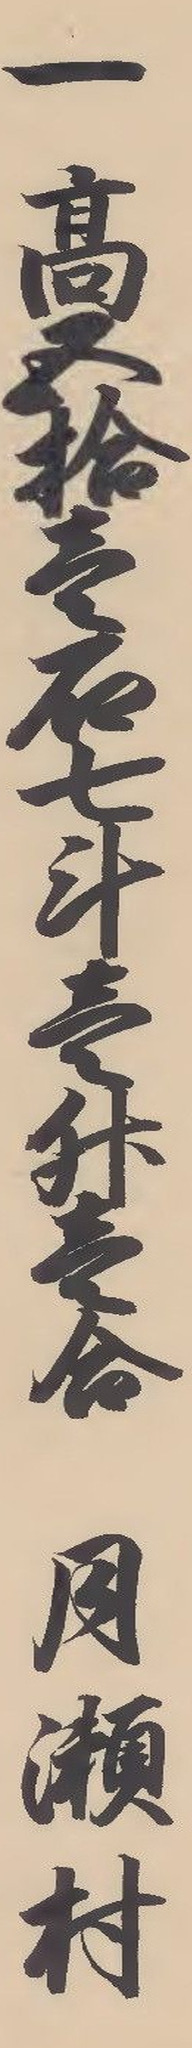一高五拾壱石七斗壱升壱合月瀬村
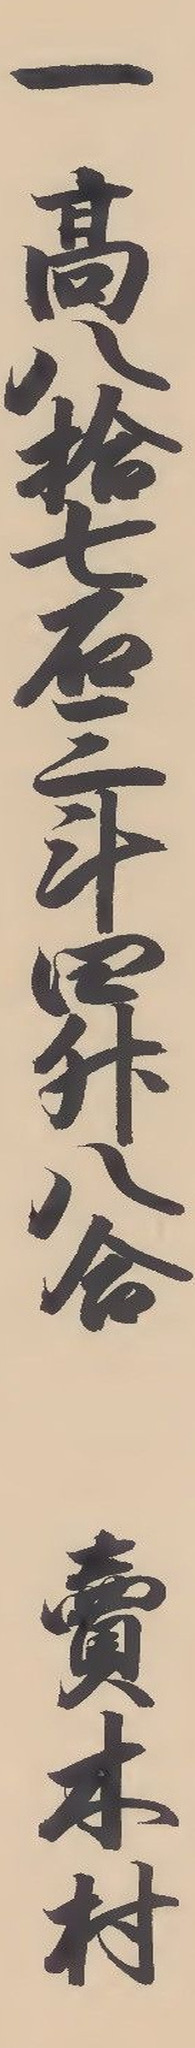一高八拾七石三斗四升八合売木村
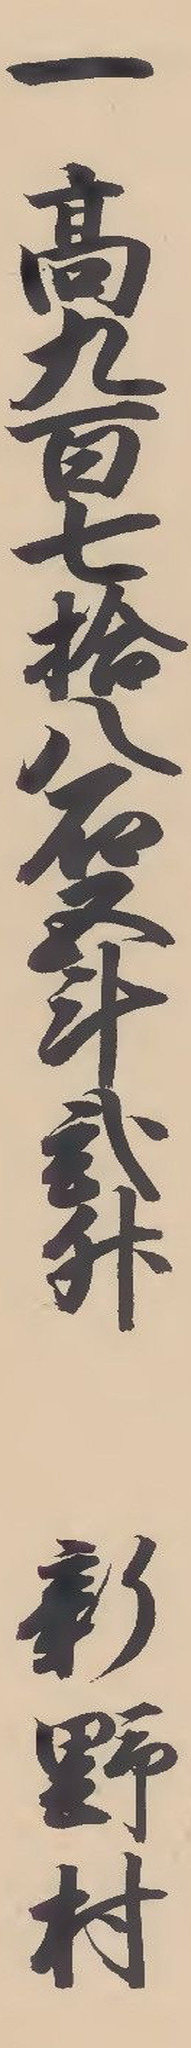一高九百七拾八石五斗弐升新野村
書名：信濃国郷帳
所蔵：国立公文書館 National Archives of Japan
